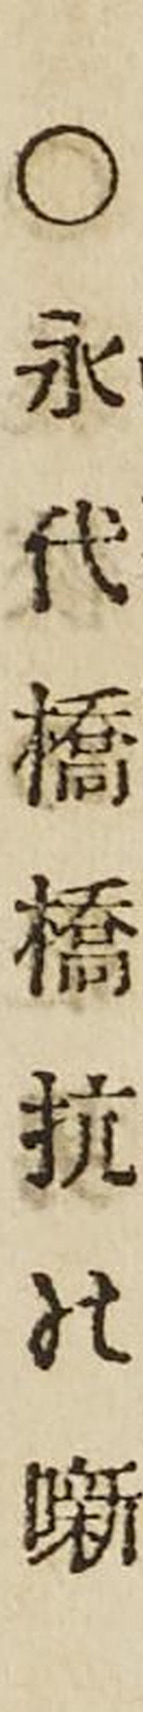○永代橋橋杭の噺
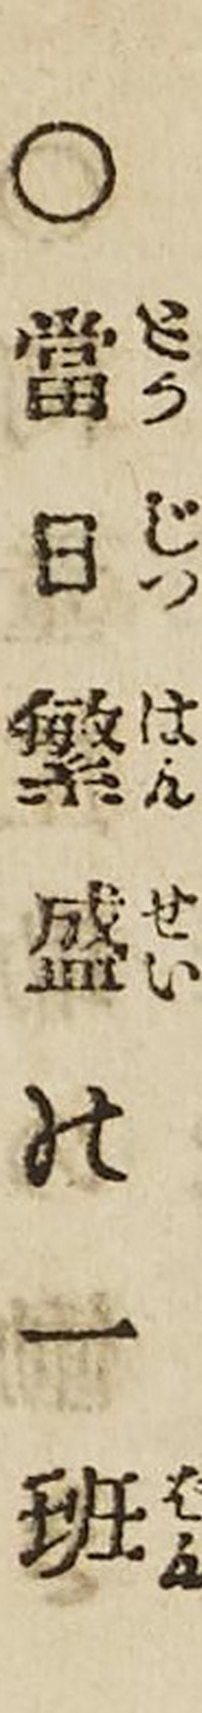○当日繁盛の一班
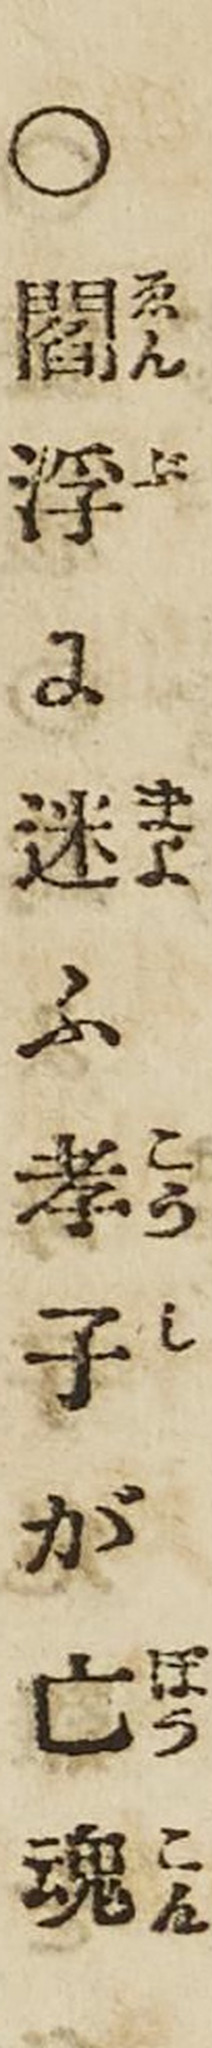○閻浮に迷ふ考子が亡魂
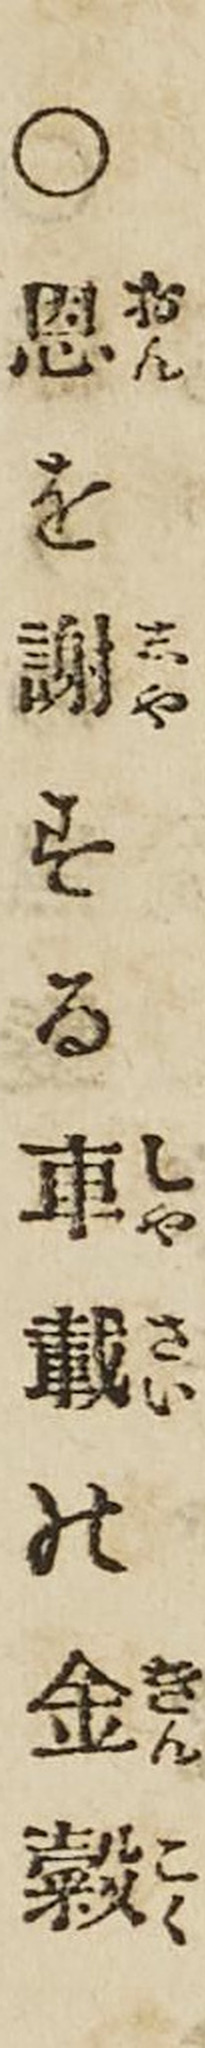○恩を謝する車載の金穀
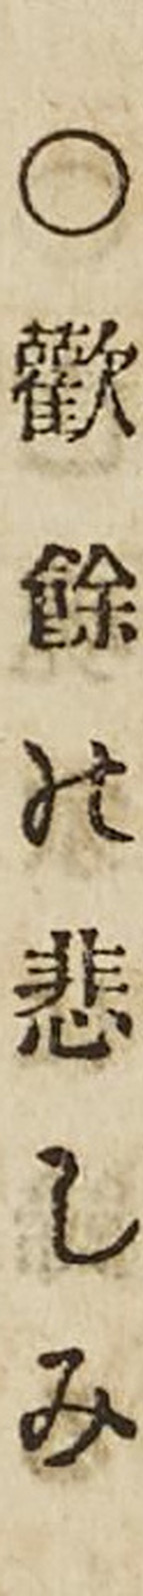○歓余の悲しみ
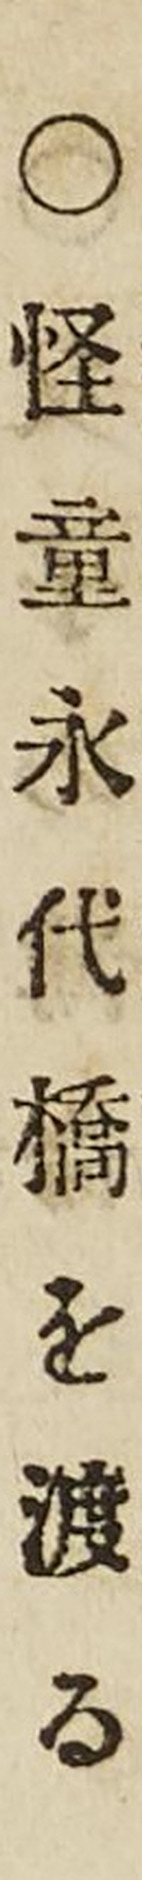○怪童永代橋を渡る
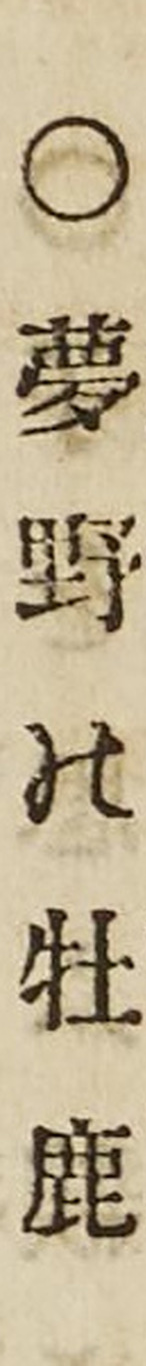○夢野の牡鹿
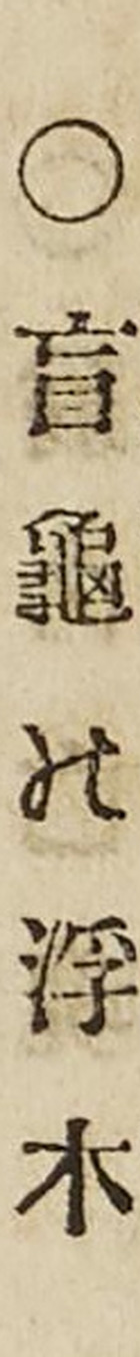○盲亀の浮木
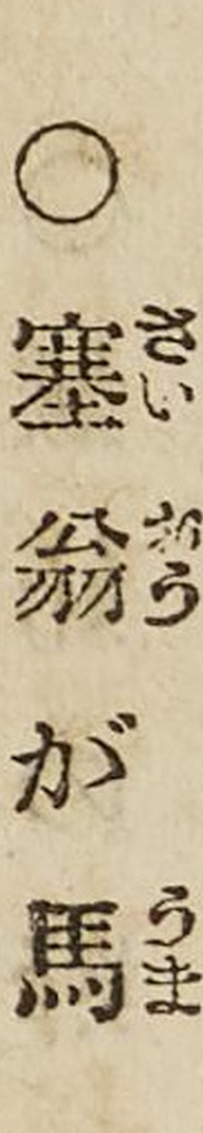○塞翁が馬
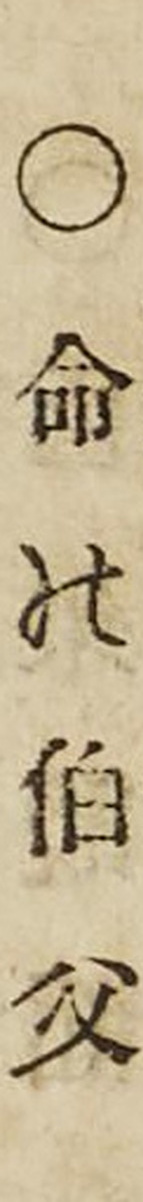○命の伯父

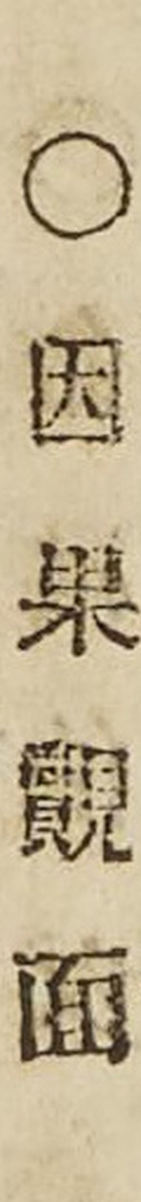○因果覿面
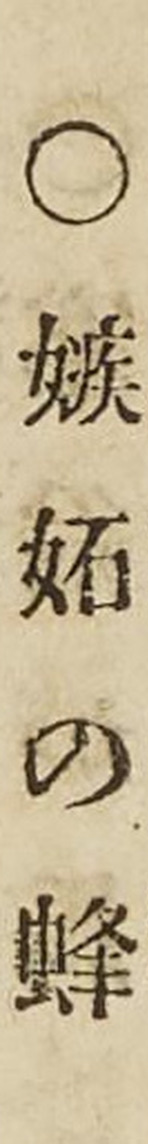○嫉妬の蜂
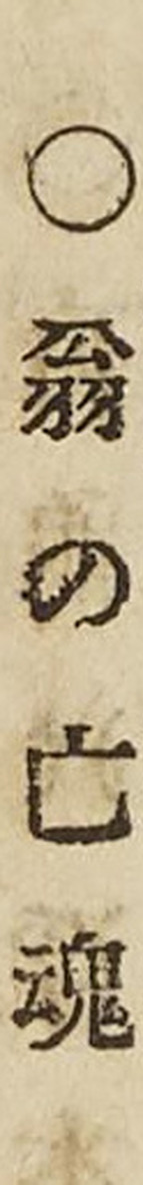○翁の亡魂
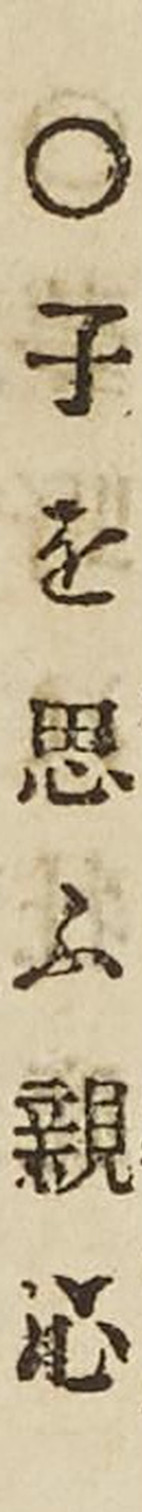○子を思ふ親心
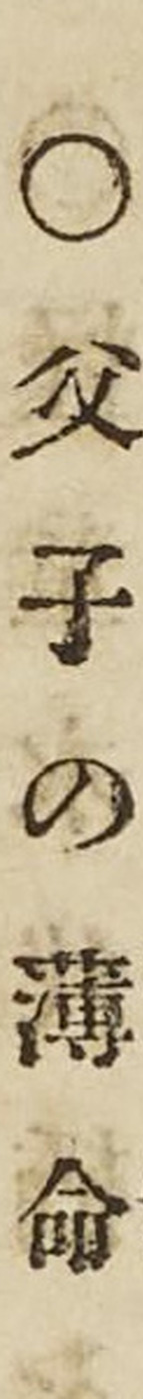○父子の薄命
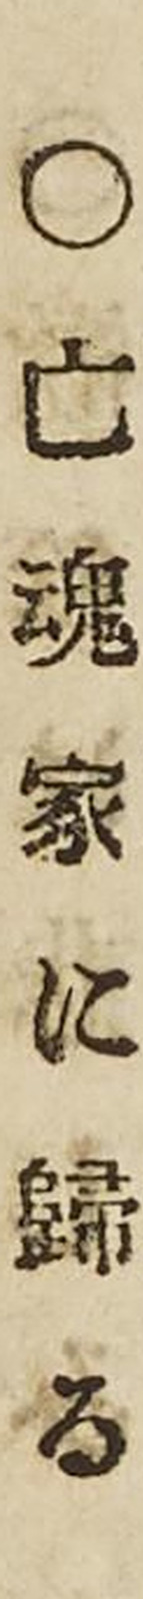○亡魂家に帰る
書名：永代惨話　文化の夢　全
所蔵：東京大学地震研究所図書室 Earthquake Research Institute Library, The University of Tokyo, JAPAN
